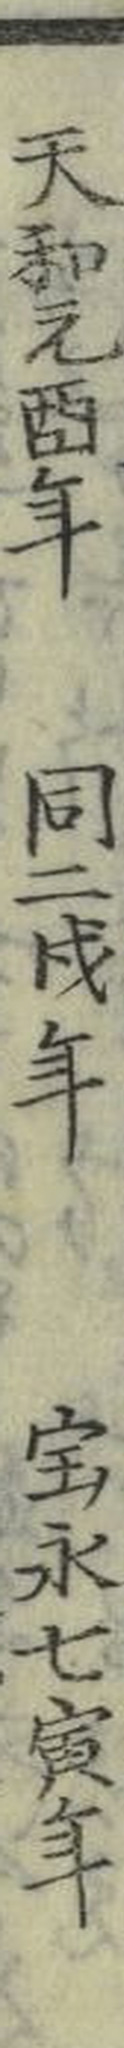天和元酉年同二戌年宝永七寅年
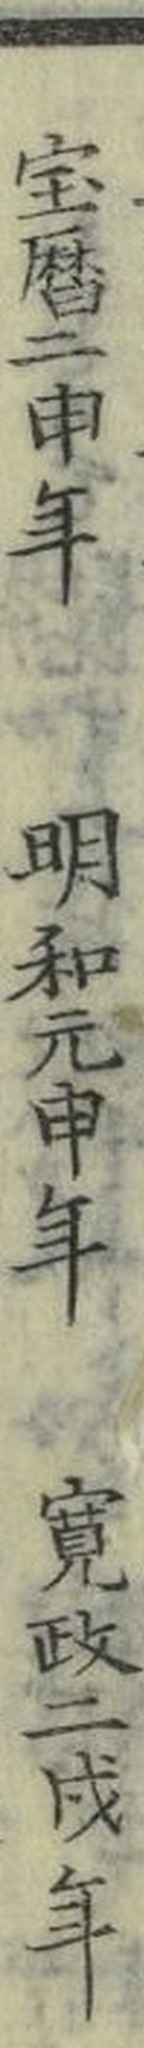天徳四午年明和元申年寛政二戌年
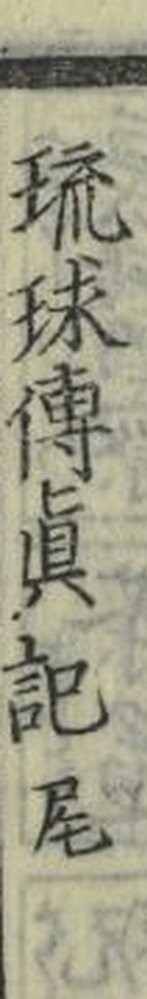琉球伝真記尾
